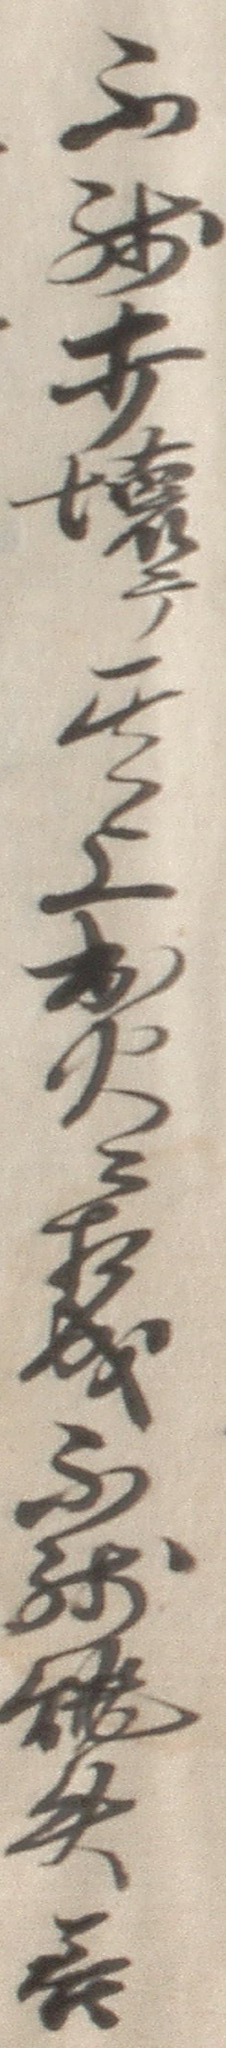不残打壊テ其上出火二相成不残焼失善
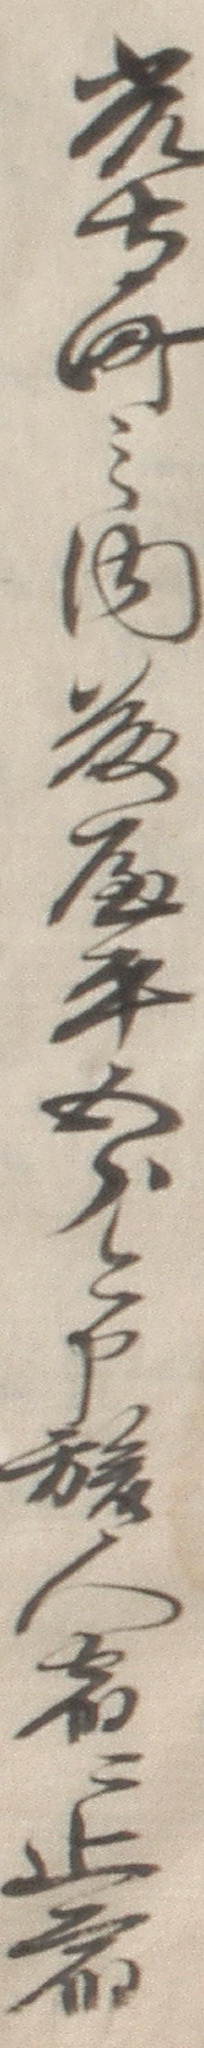光寺町之内藤屋平五郎と申旅人宿二止宿
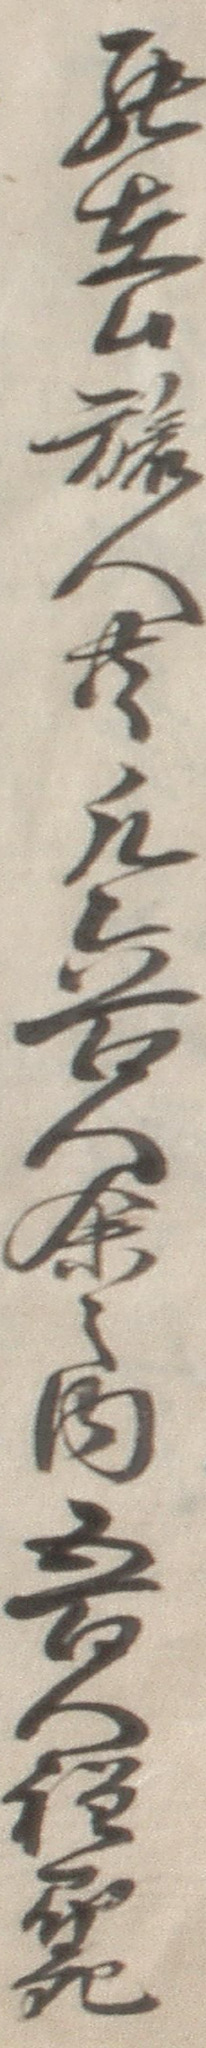罷在候旅人共凡六百人余之内五百人程即死
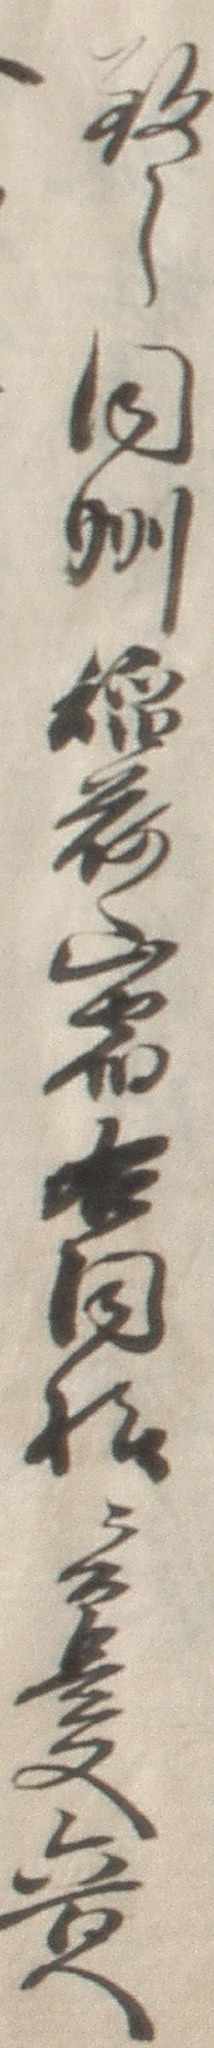致し同州稲荷山宿右同様二而是又六百人
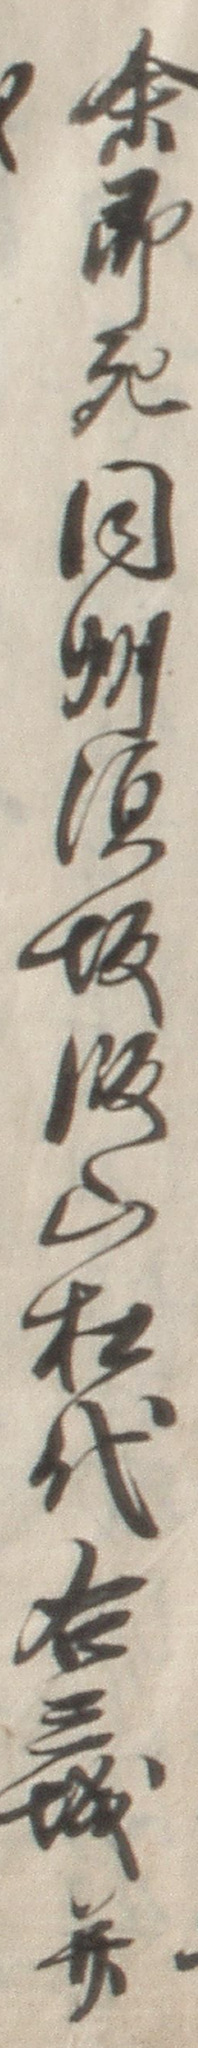余即死同州須坂飯山松代右三城并
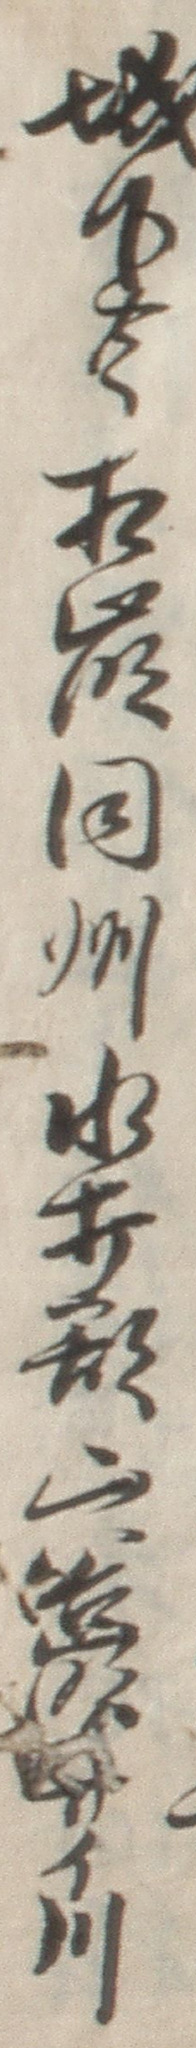城下共相崩同州水打郡山谷崩サイ川

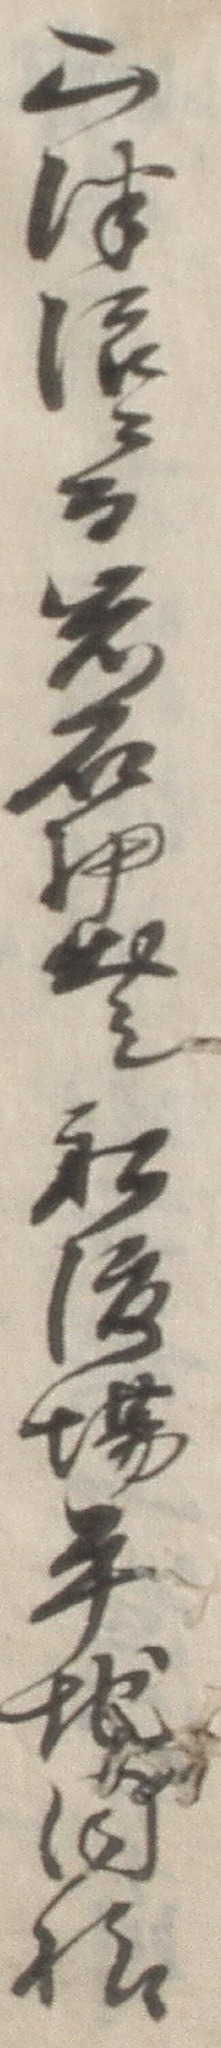山津浪二而岩石押出シ船渡場平地同様
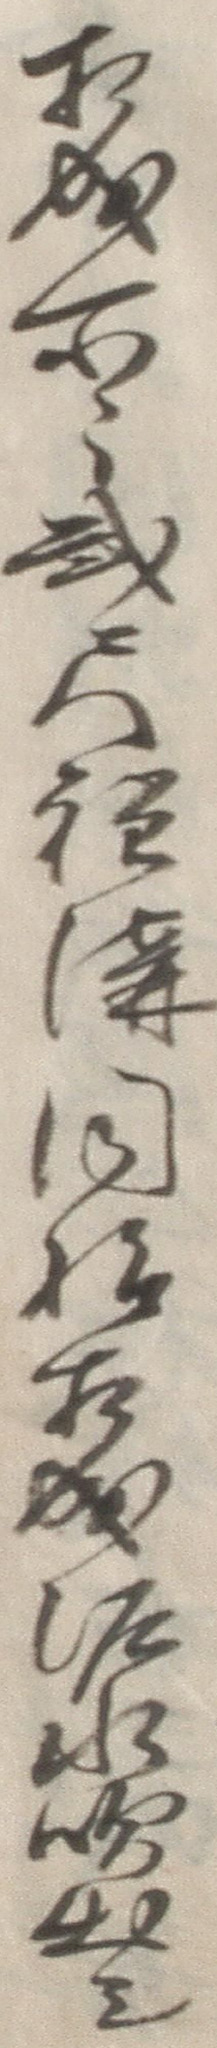相成所々弐尺程溝同様相成泥水吹出シ
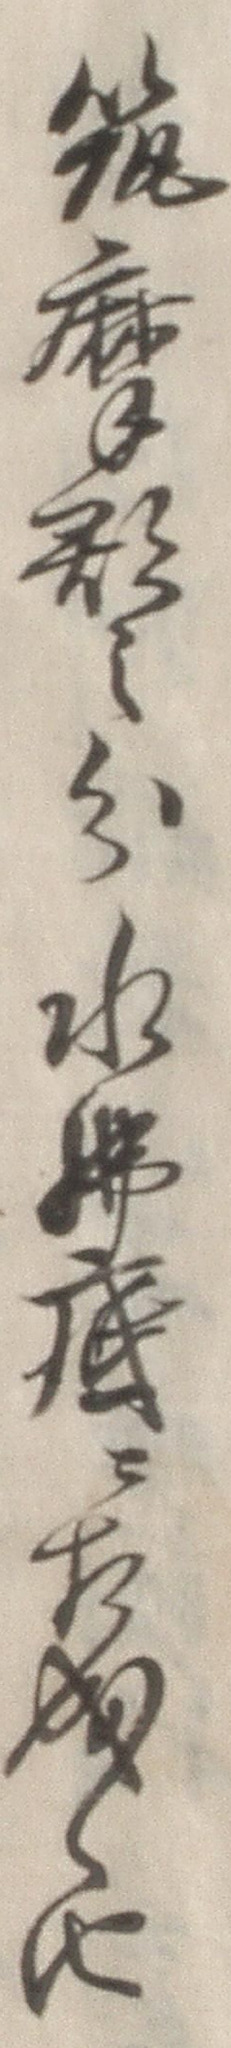筑摩郡之分水払底二相成候由
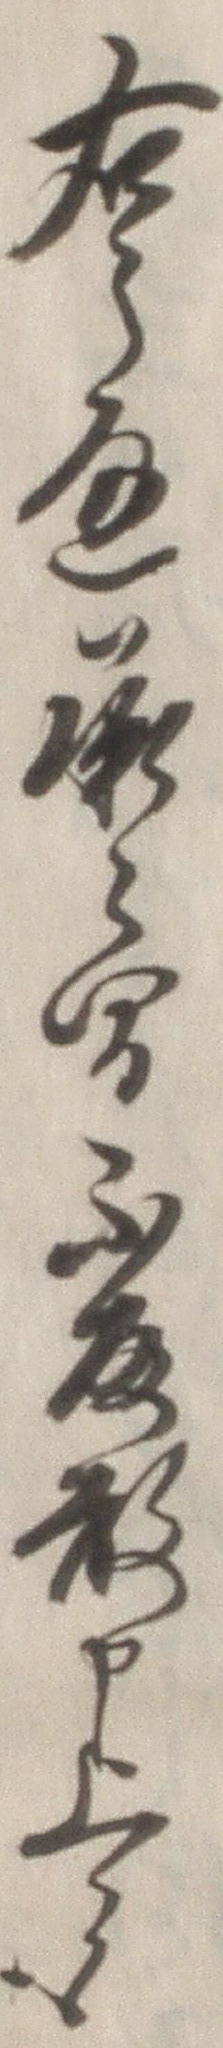右之通承候間不取敢申上候以上
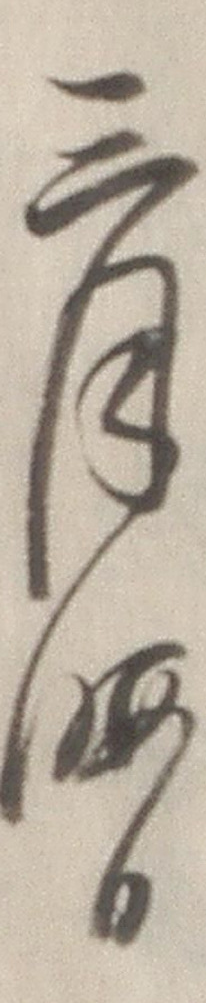三月晦日
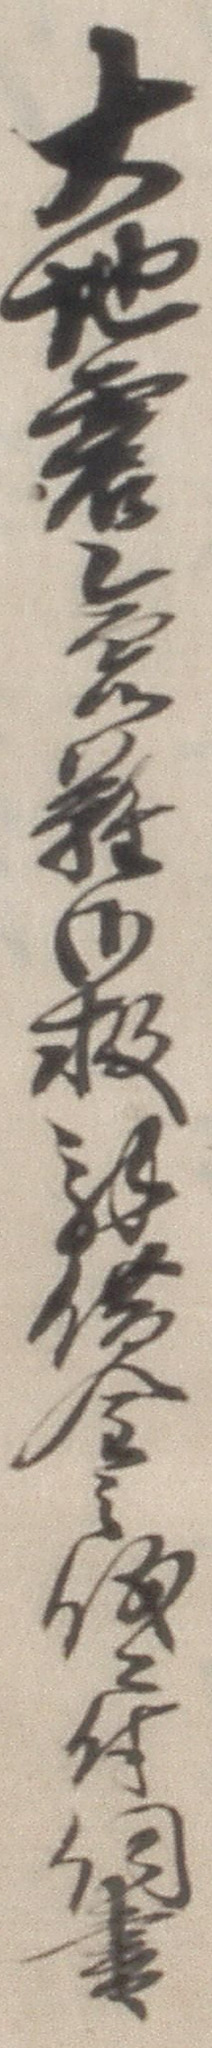大地震急難御救拝借金之儀二付伺書
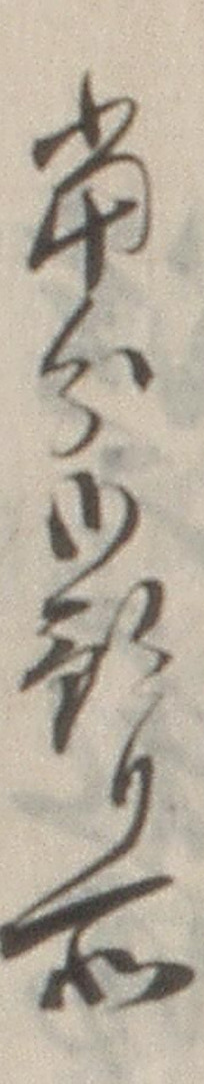当分御預り所
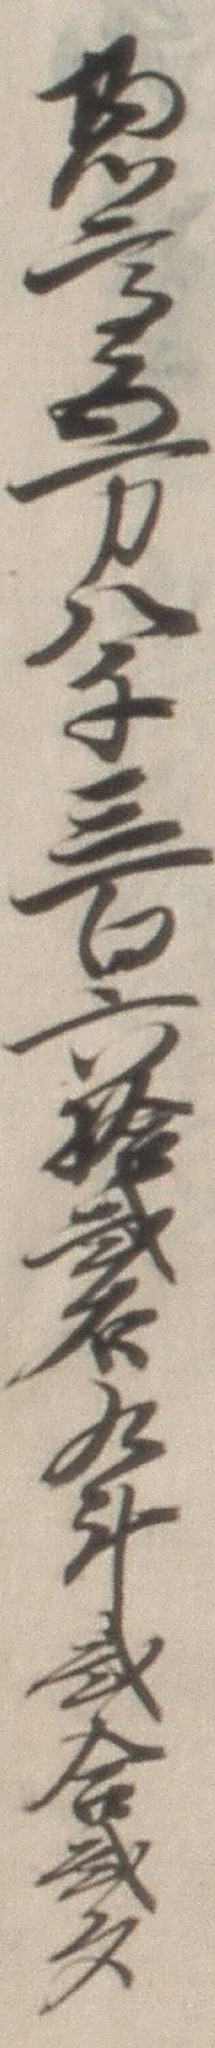惣高五万八千三百六拾弐石九斗弐合弐勺
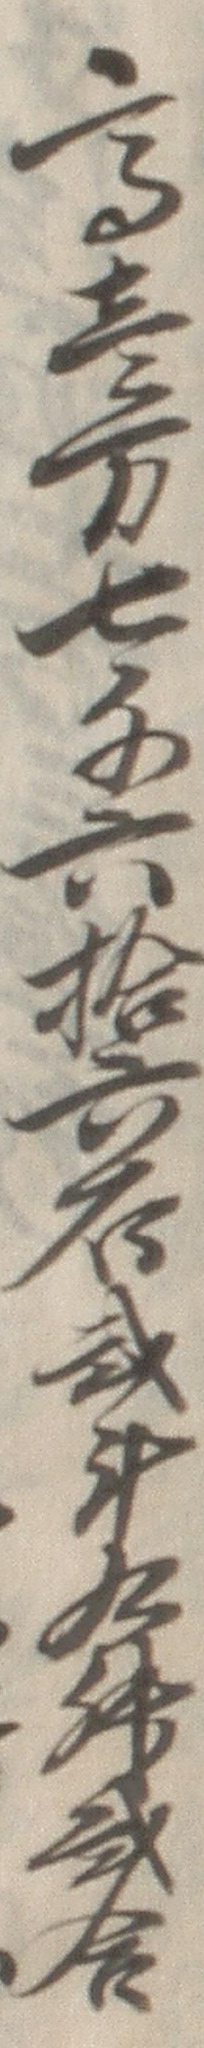高壱万七千六拾六石弐斗九升弐合
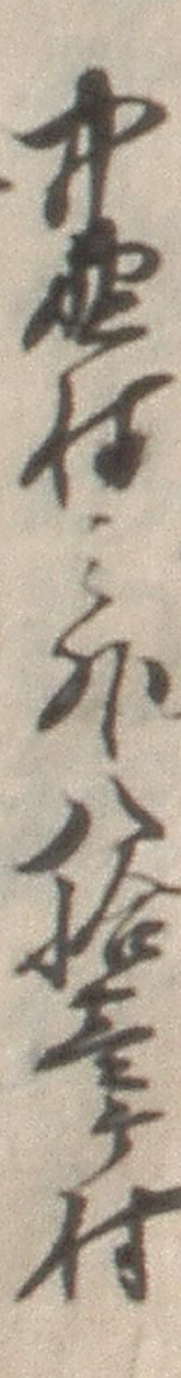中野村之外八拾壱ヶ村
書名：信州地震一件
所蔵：東京大学地震研究所図書室 Earthquake Research Institute Library, The University of Tokyo, JAPAN
